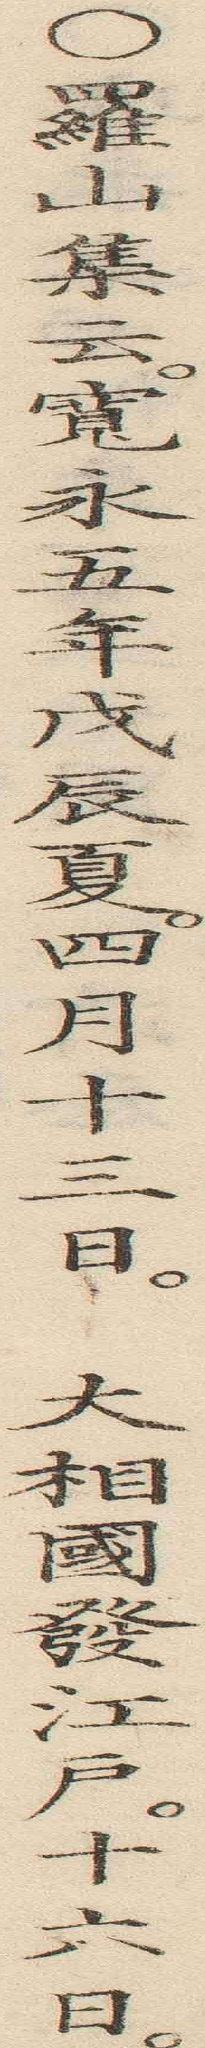○羅山集云。寬永五年戊辰夏。四月十三日大相國發江戸。十六日。
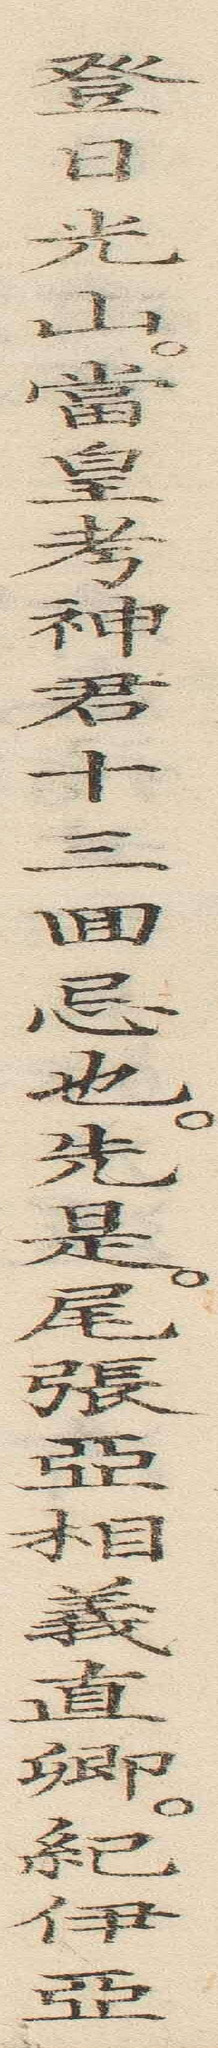登日光山。當皇考神君十三囬忌也。先是。尾張亞相義直卿。紀伊亞
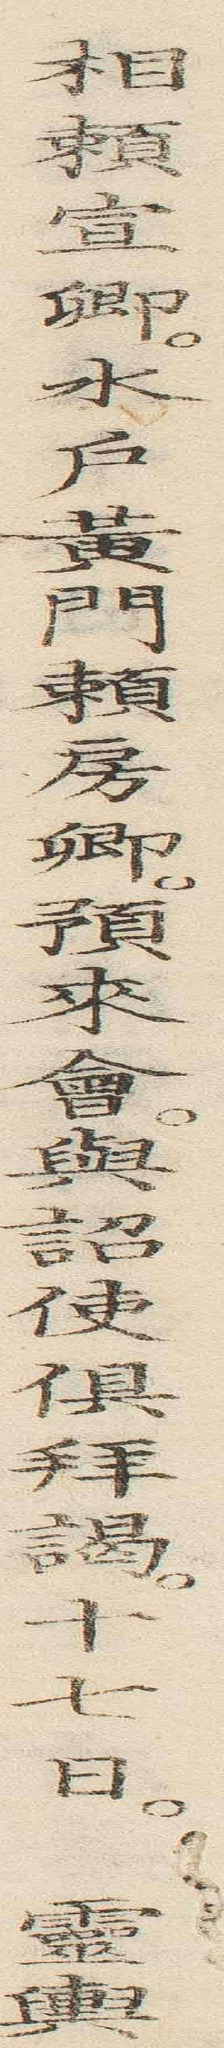相頼宣卿。水戸黄門頼房卿。預來會。與詔使俱拜謁。十七日。靈輿
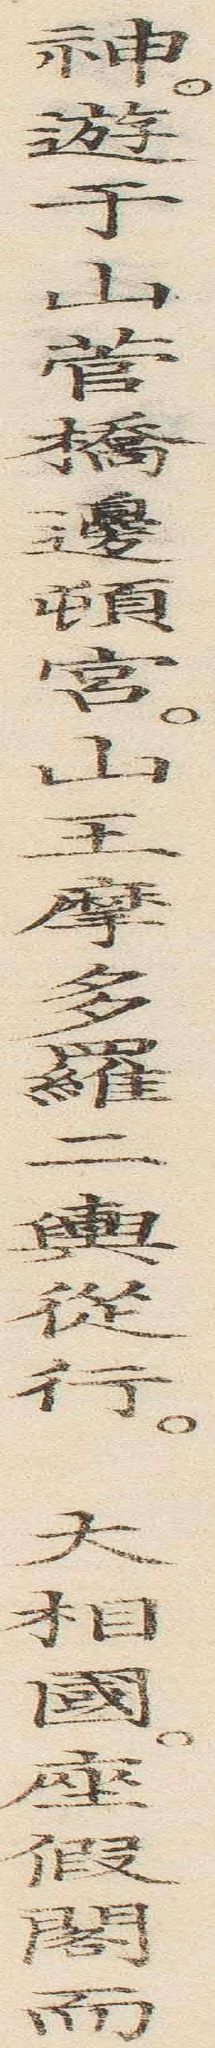神。遊于山菅橋邊頓宮。山王摩多羅二輿從行。大相國。座假閣而
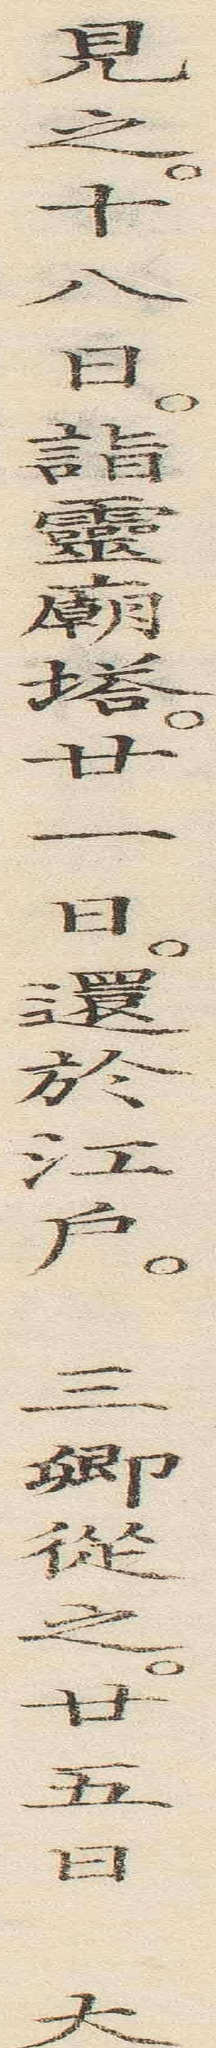見之。十八日。詣靈廟塔。廿一日。還於江戸。三卿從之。廿五日大
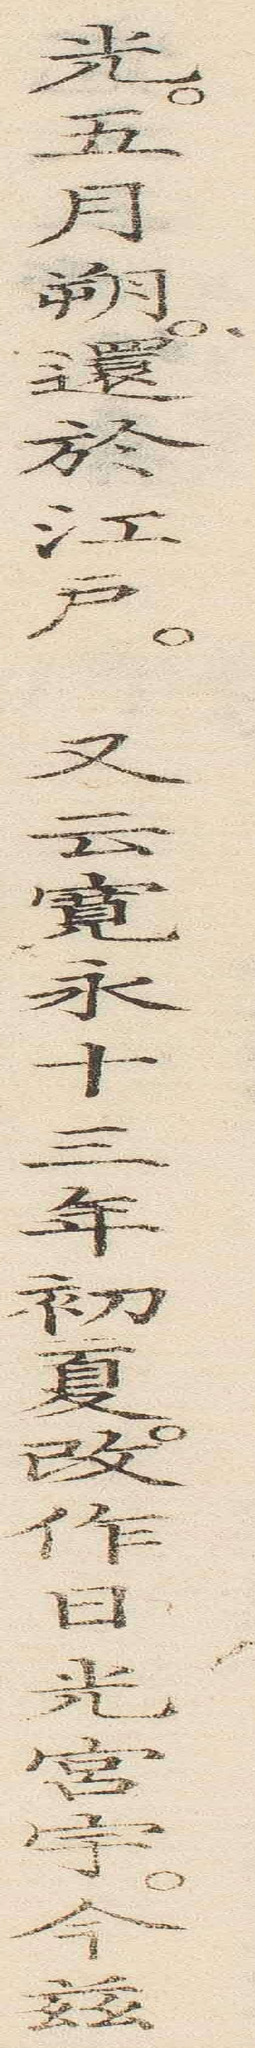光。五月朔。還於江戸。又云寛永十三年初夏。改作日光宮宇。今兹
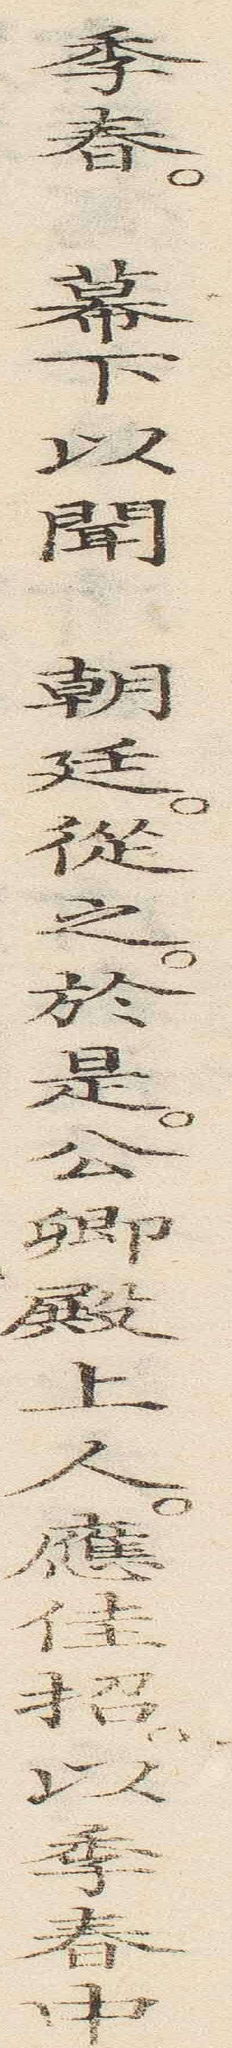季春。幕下以聞朝廷。從之。於是。公卿殿上人。應佳招。以季春中
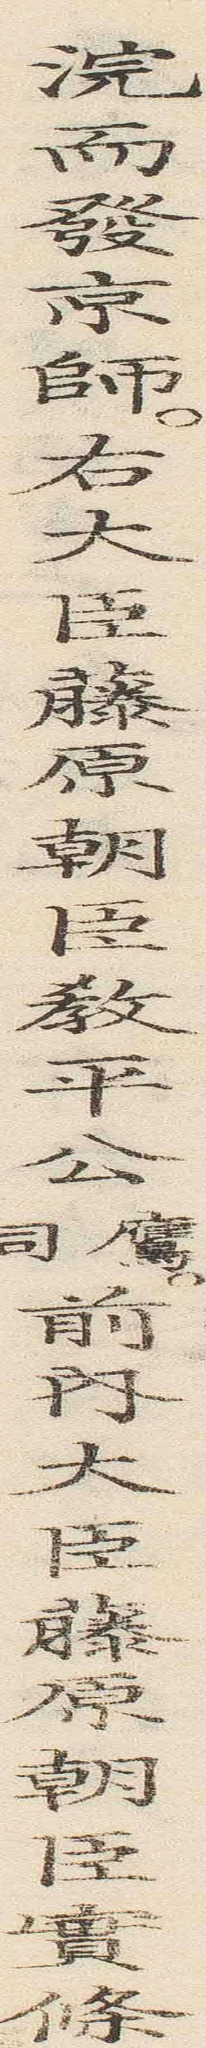浣而發京師。右大臣藤原朝臣敎平公鷹司。前内大臣藤原朝臣實條
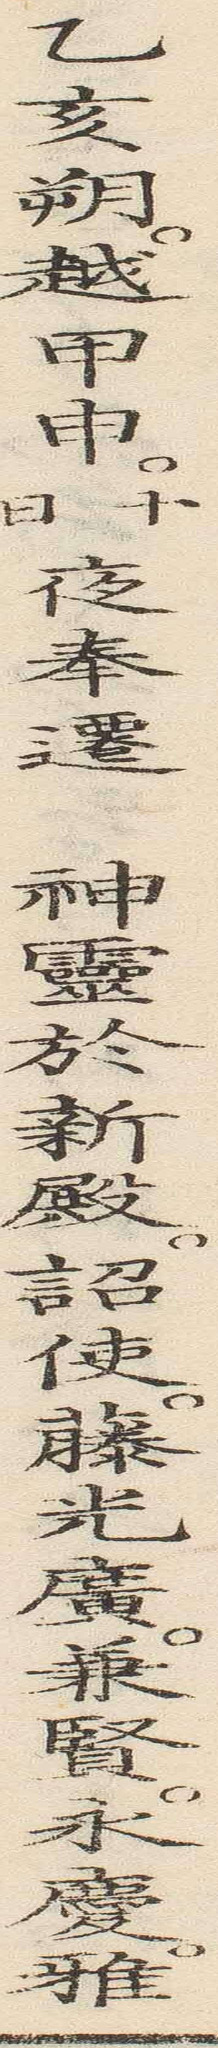乙亥朔。越甲申。十日夜奉遷神靈於新殿。詔使。藤光廣。兼賢。永慶。雅
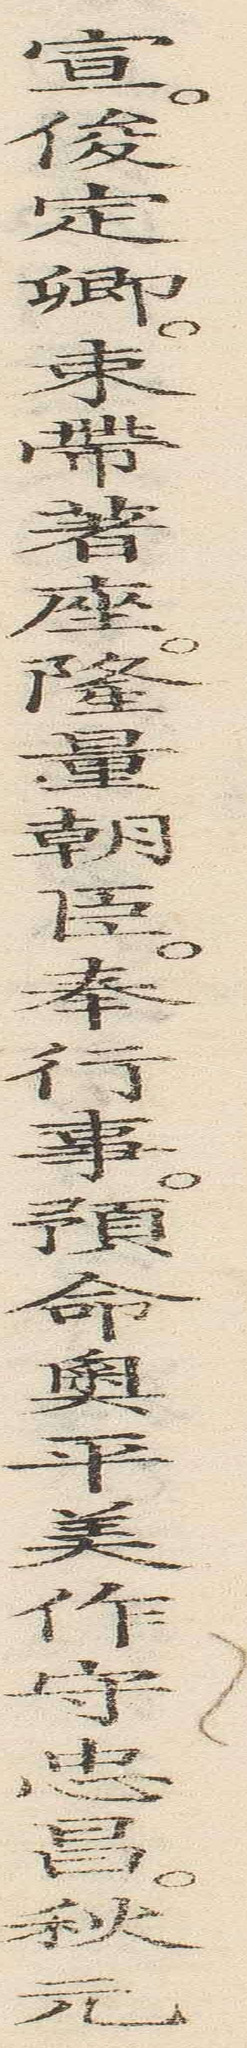宣。俊定卿。束帶著座。隆量朝臣。奉行事。預命奥平美作守忠昌。秋元
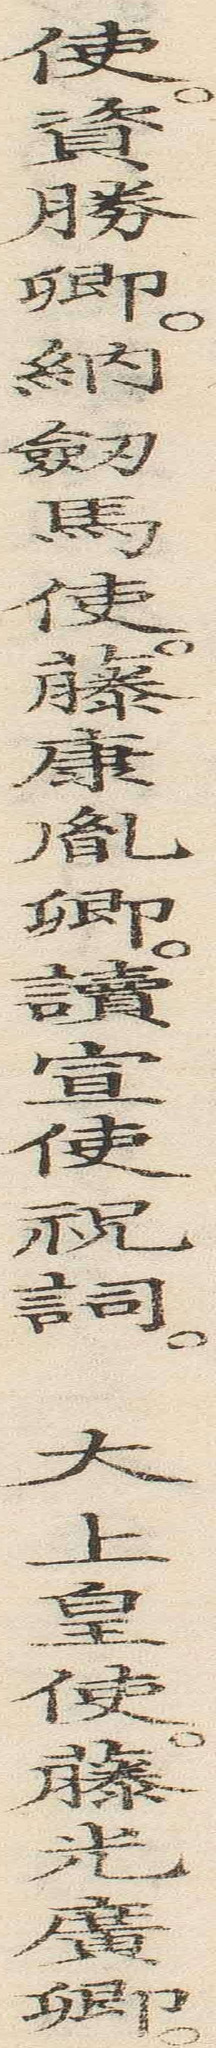使。資勝卿。納劔馬使。藤原康胤卿。讀宣使祝詞。大上皇使。藤光廣卿。
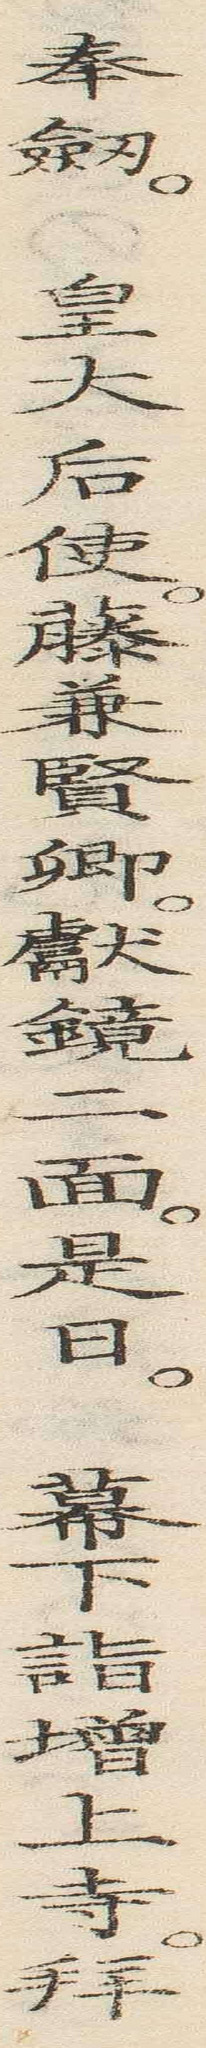奉劔。皇大后使。藤兼賢卿。獻鏡二面。是日。幕下詣增上寺。拜
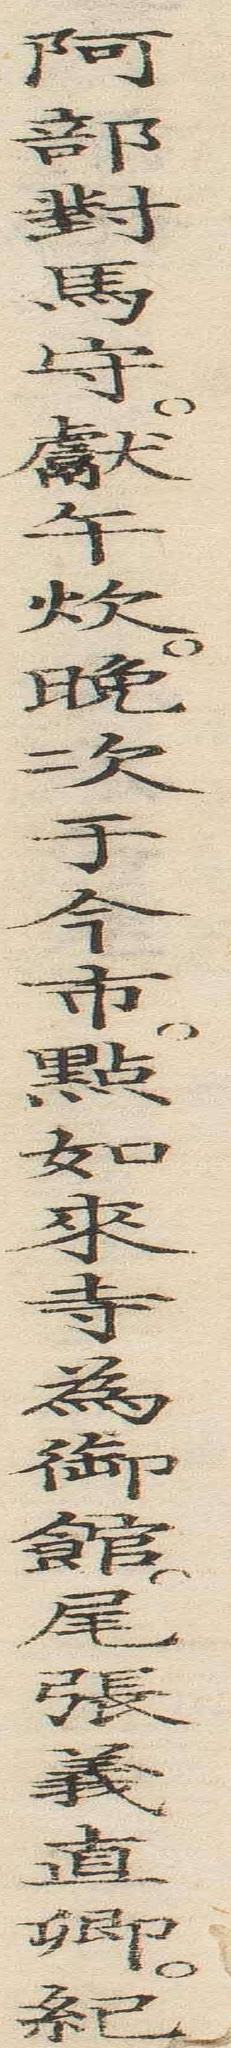阿部對馬守。獻午炊。晩次于今市。㸃如來寺為御館。尾張義直卿。紀
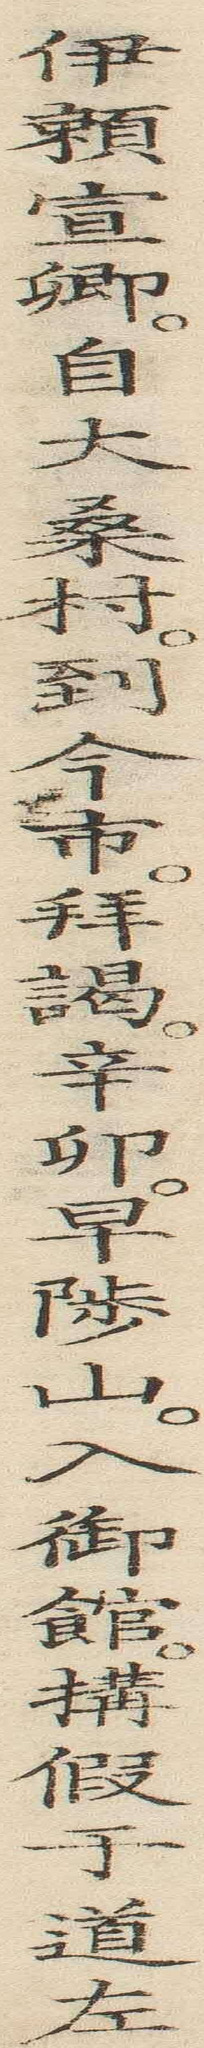伊頼宣卿。自大桑村。到今市。拜謁。辛卯。早陟山。入御館。搆假于道左
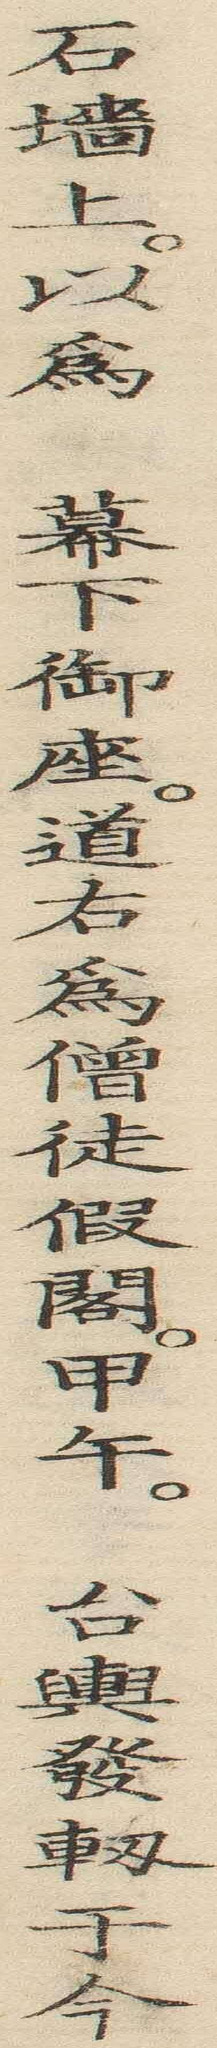石墻上。以爲幕下御座。道右爲僧徒假閣。甲午。台輿發軔于今

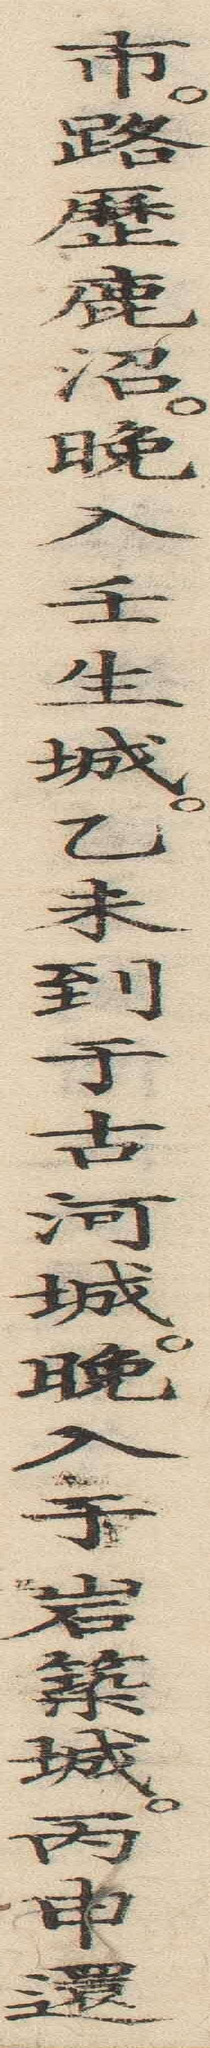市。路歴鹿沼。晩入壬生城。乙未到于古河城。晩入于岩築城。丙申還
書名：日光山志
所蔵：東京学芸大学附属図書館 国文学研究資料館
